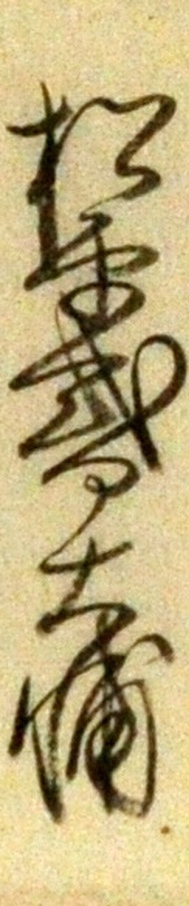松平式部大輔
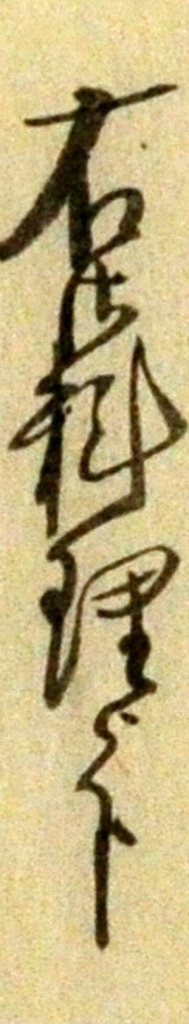右御料理被下
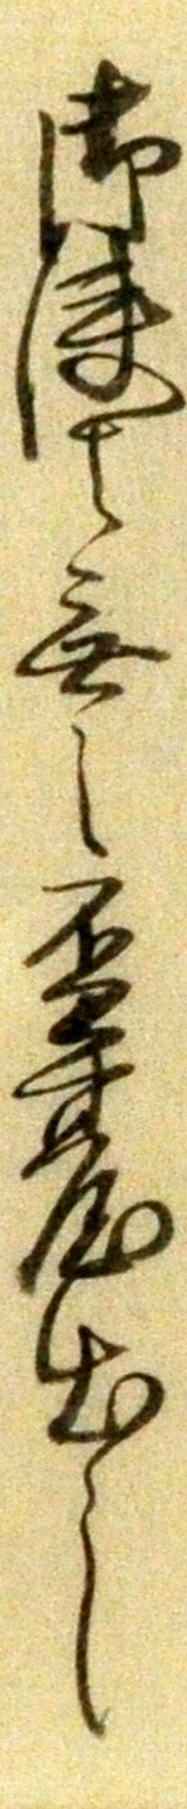御使は無之盃台出之
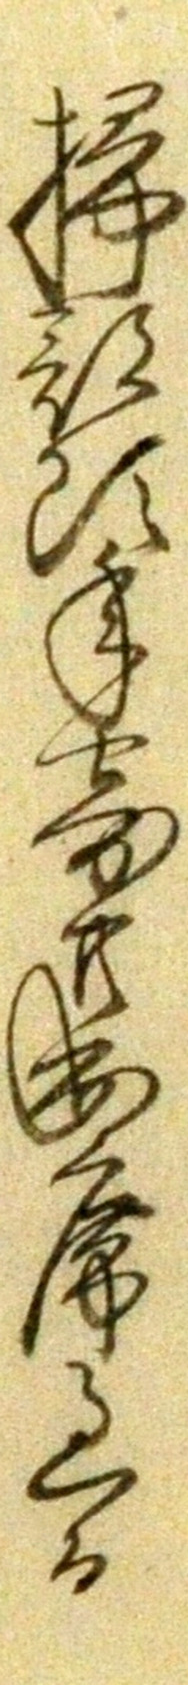掃部頭年寄共出席過而
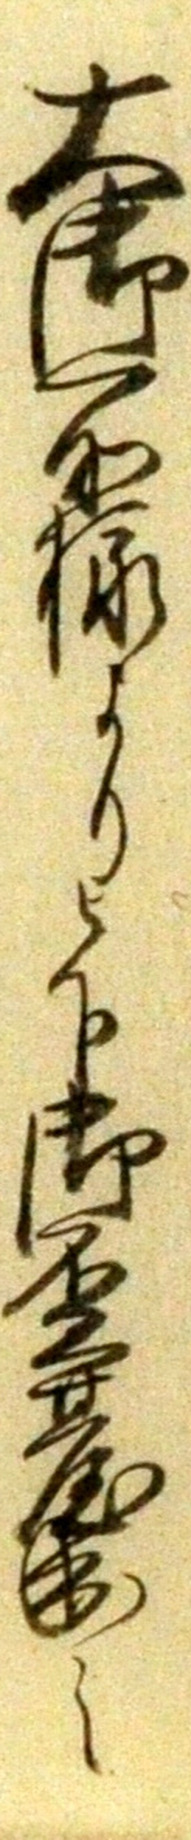大御所様より被下御盃台出之
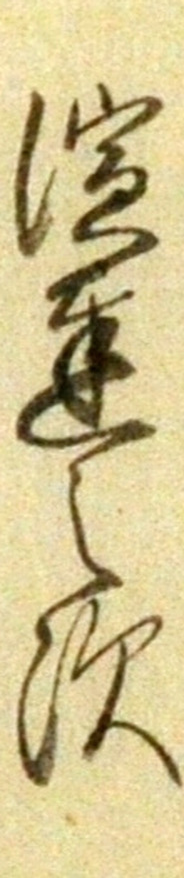演達之次
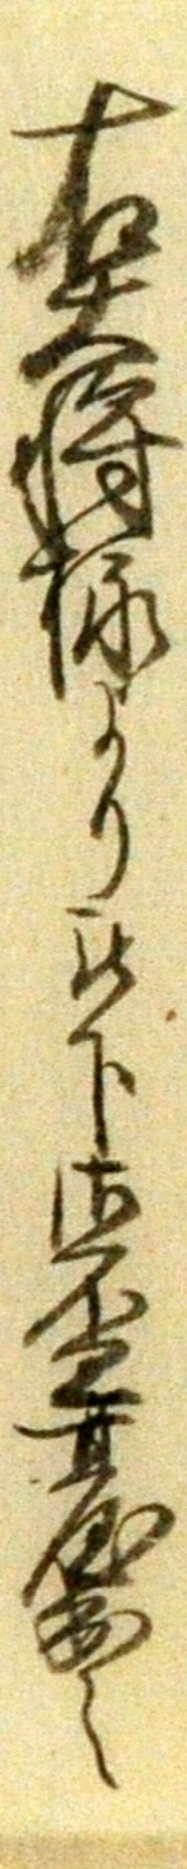右大将様より被下御盃台出之
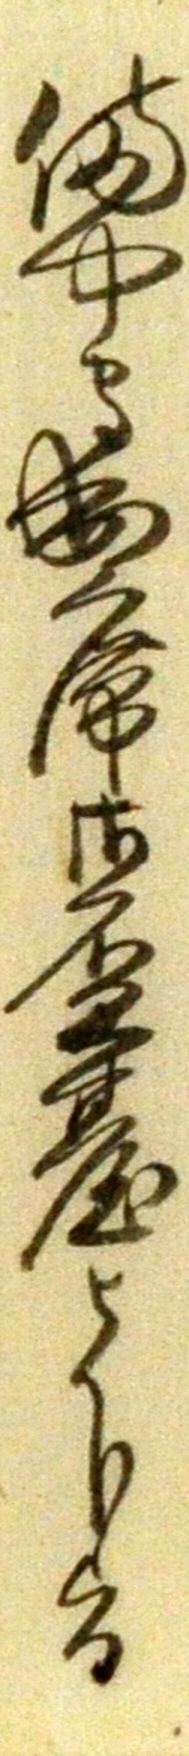備中守出席御盃台被下旨

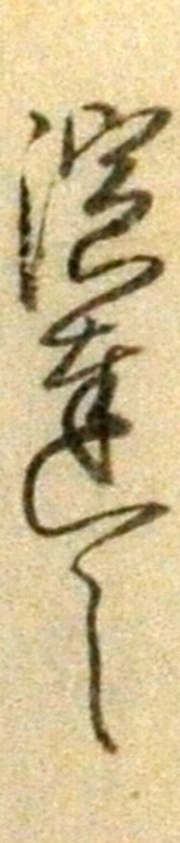演達之
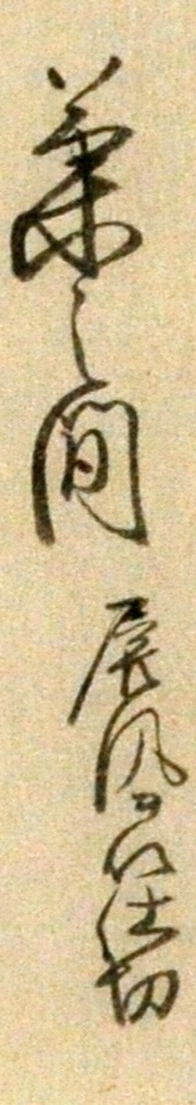菊之間屏風ヲ以仕切
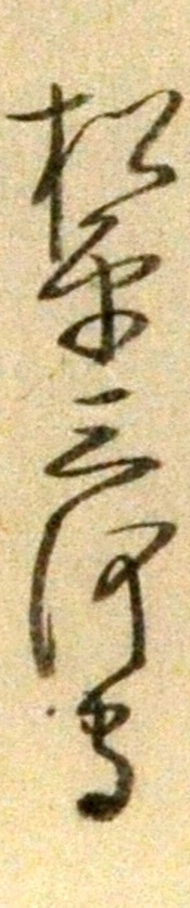松平三河守
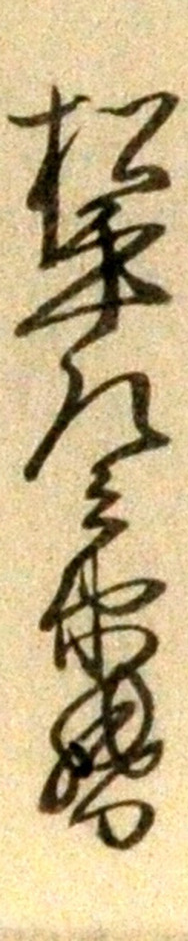煩松平左兵衛督
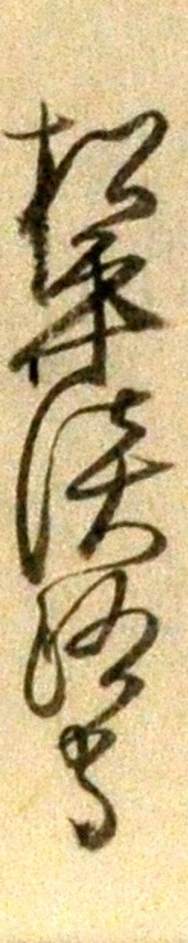松平淡路守
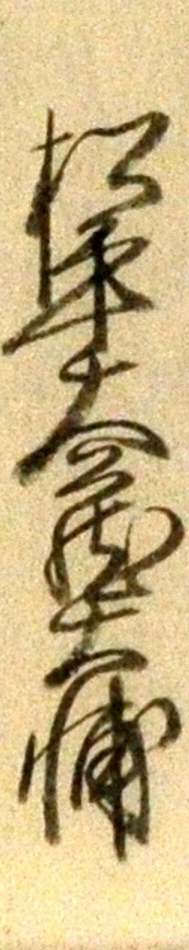松平大蔵大輔
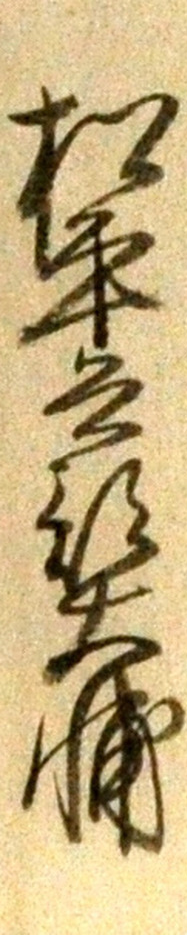煩松平兵部大輔
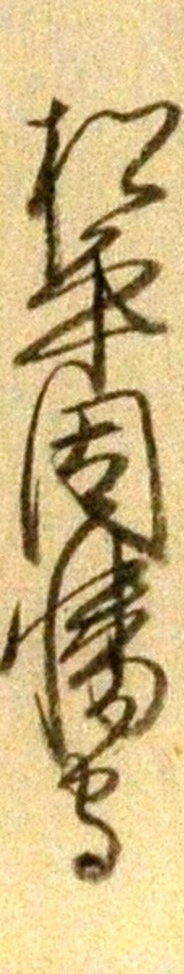煩松平因幡守
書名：御馳走御能ノ節ノ留外
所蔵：伊那市立高遠町図書館・合同会社AMANE
